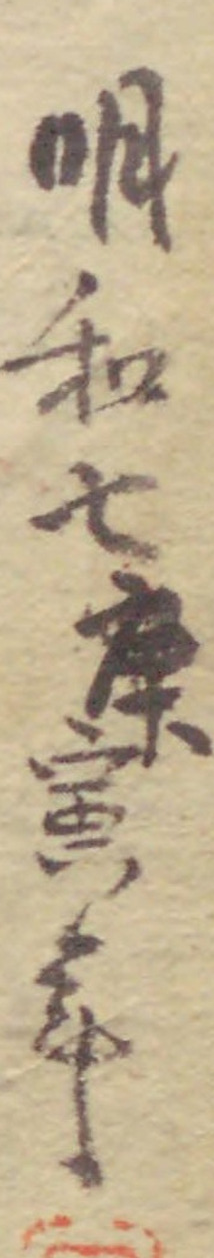明和七庚寅年
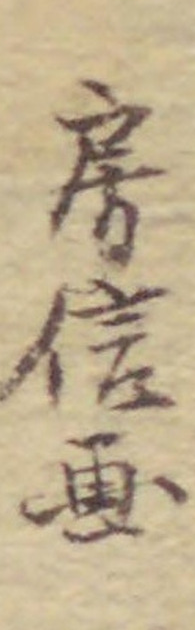房信画
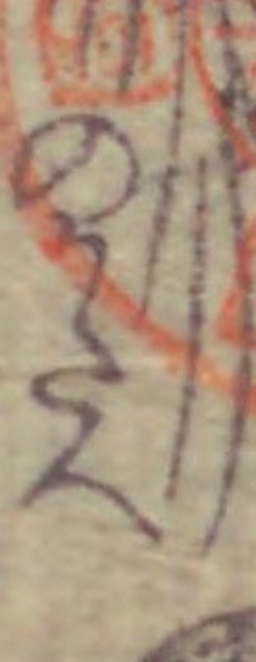のかたへ
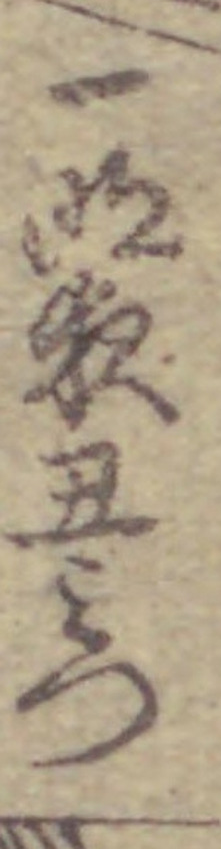一明夜丑みつ
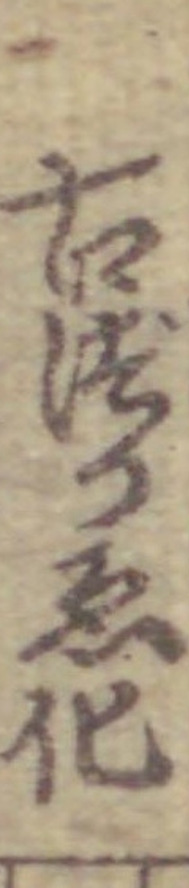古づかゑ化
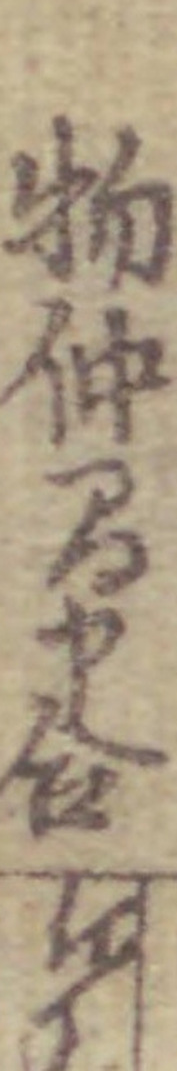物仲間申合
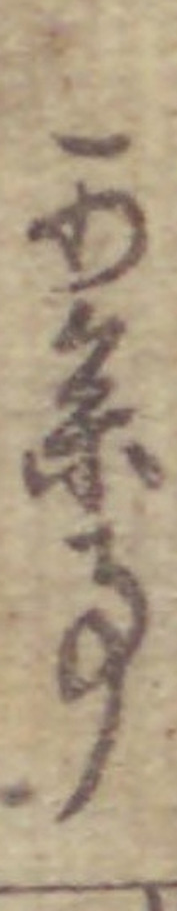可参事
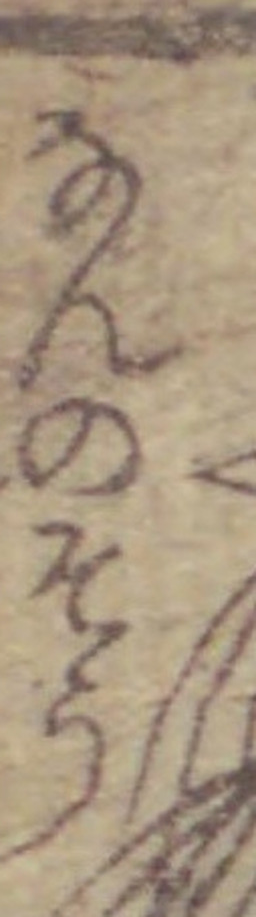なんのそう

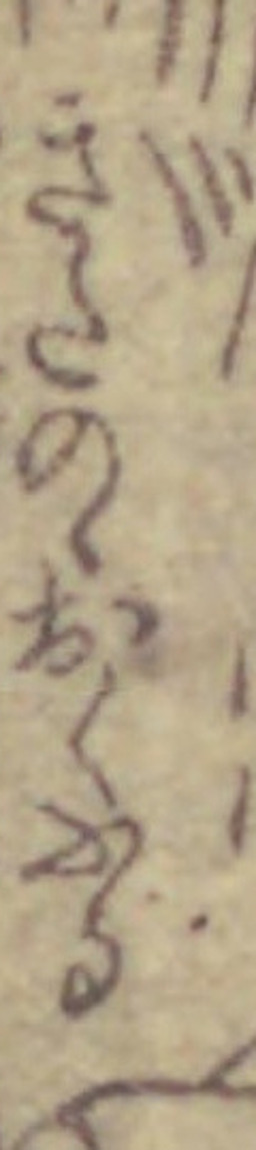きたのゝおくふる
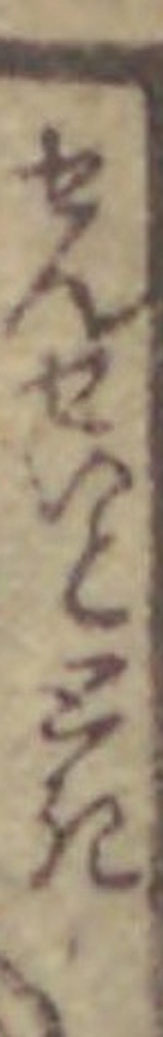せんせいととき
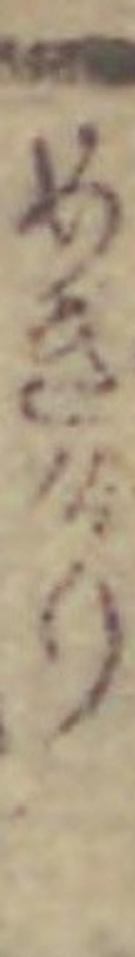めきけり

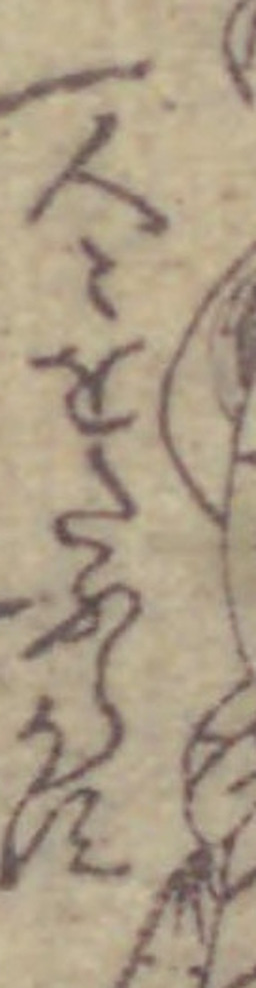人々をたふらかす
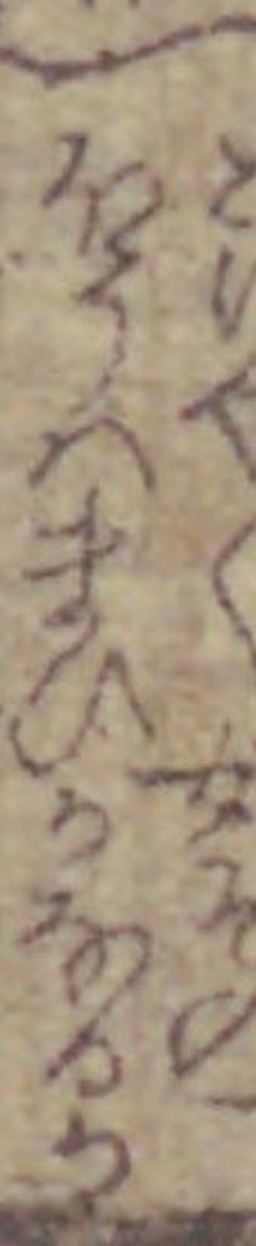ほうはまひかなるか
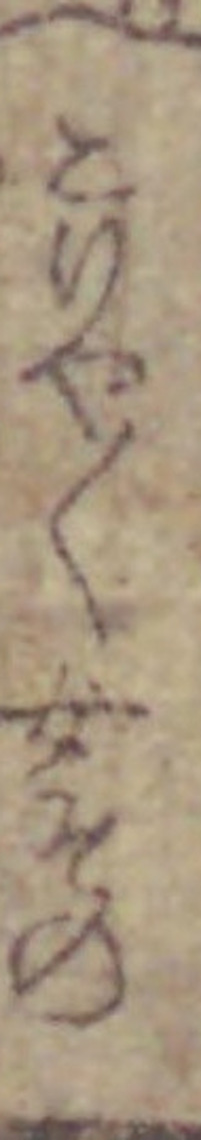こりや〳〵女その
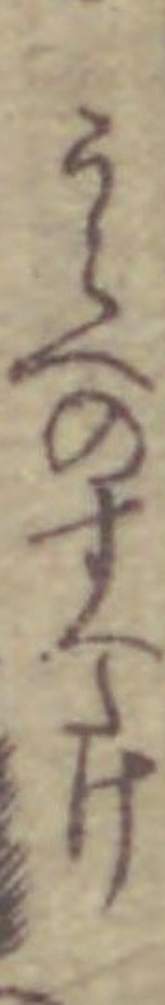うらへのすへたけ
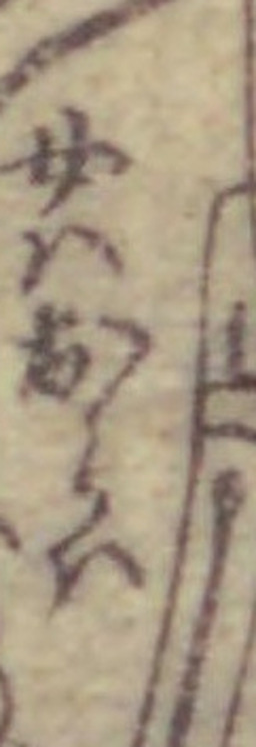女はおらは
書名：とんだ茶釜 2巻
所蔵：国立国会図書館 National Diet Library, JAPAN
